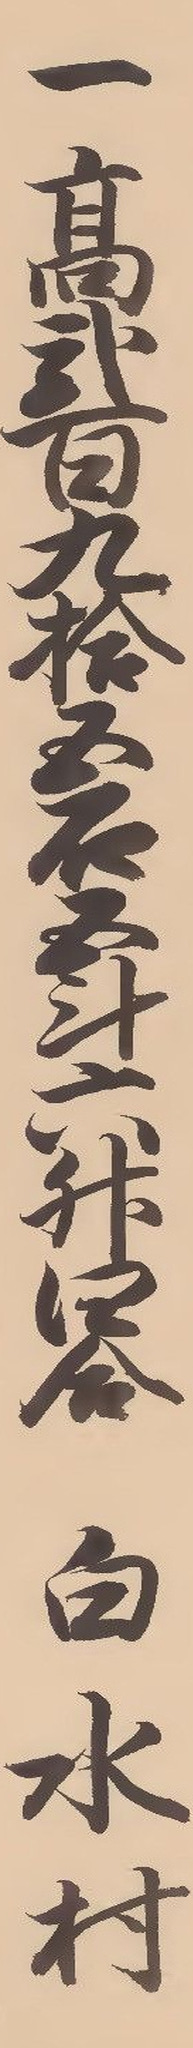一高弐百九拾五石五斗六升四合白水村
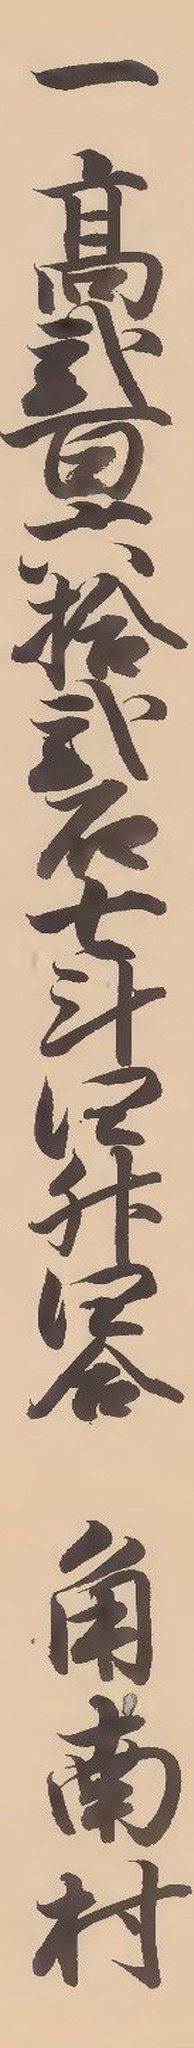一高弐百六拾弐石七斗四升四合角南村
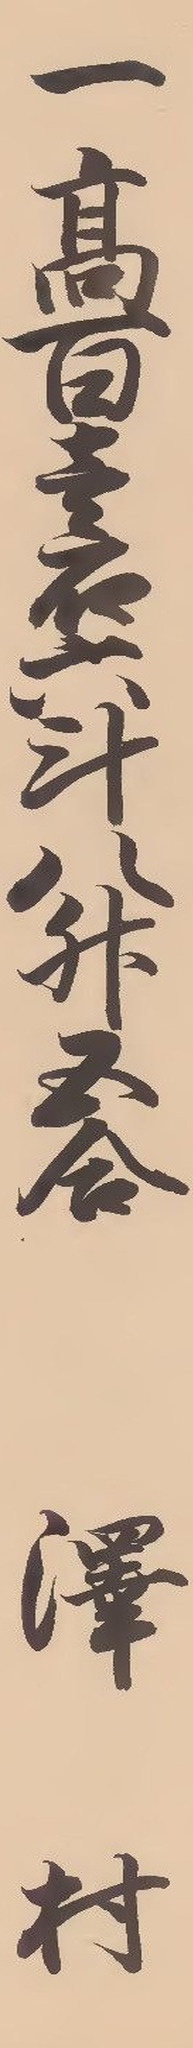一高百壱石六斗八升五合沢村
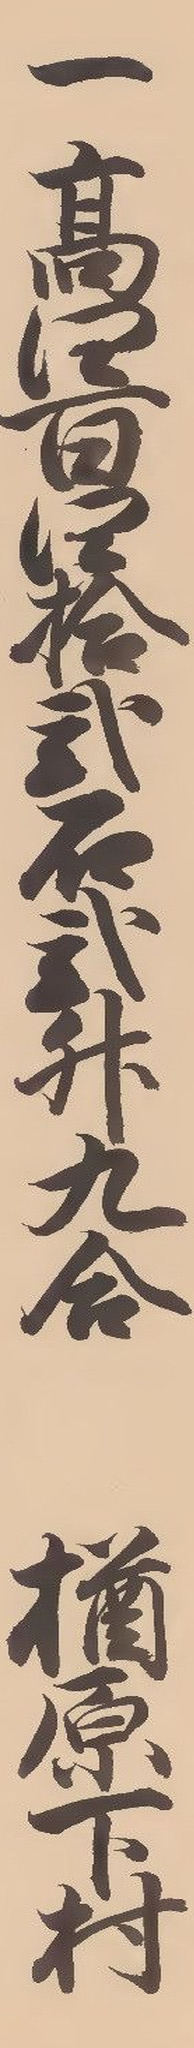一高四百四拾弐石弐升九合楢原下村
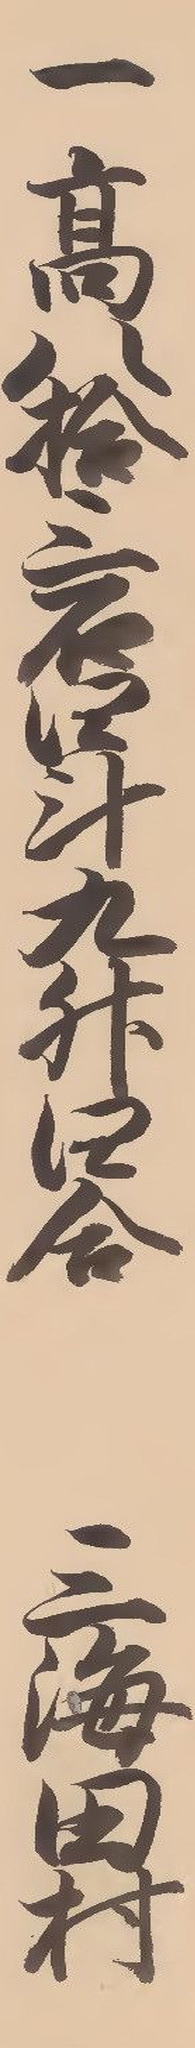一高八拾三石四斗九升四合三海田村
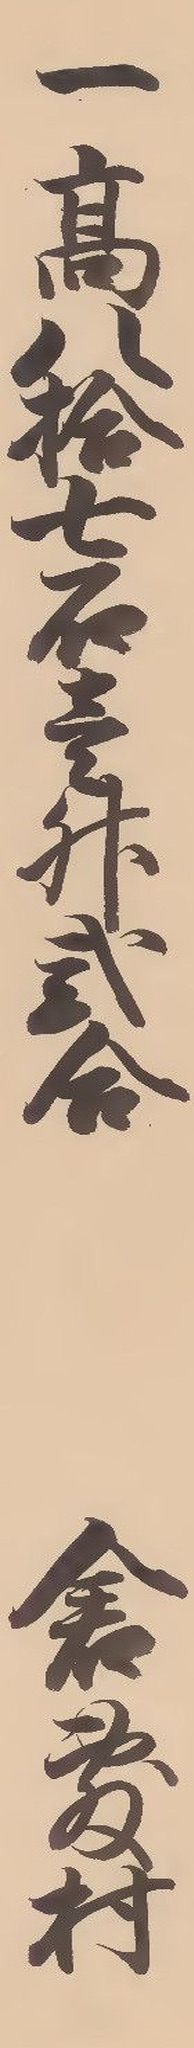一高八拾七石壱升弐合倉敷村
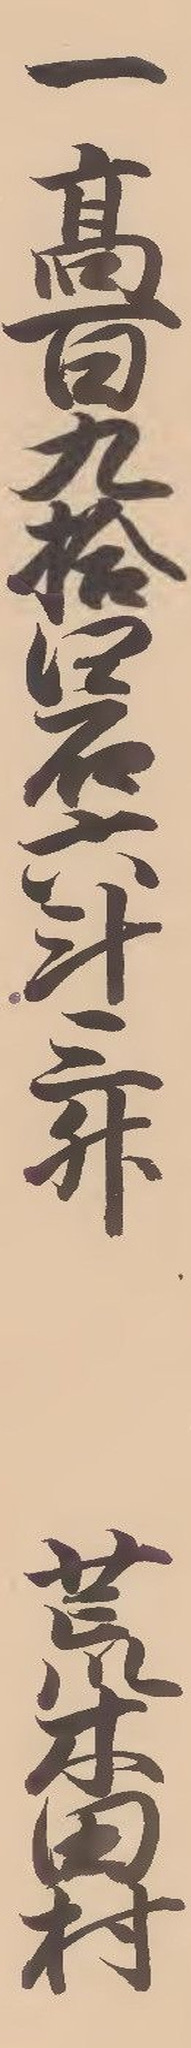一高百九拾四石六斗三升荒木田村

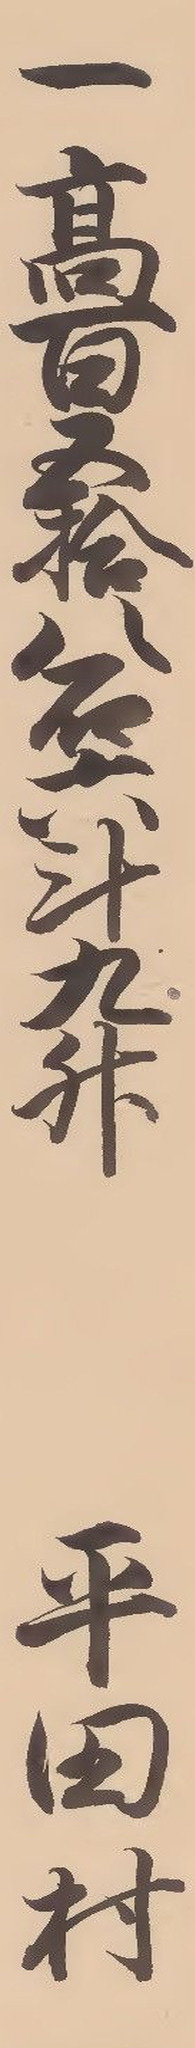一高百五拾八石六斗九升平田村
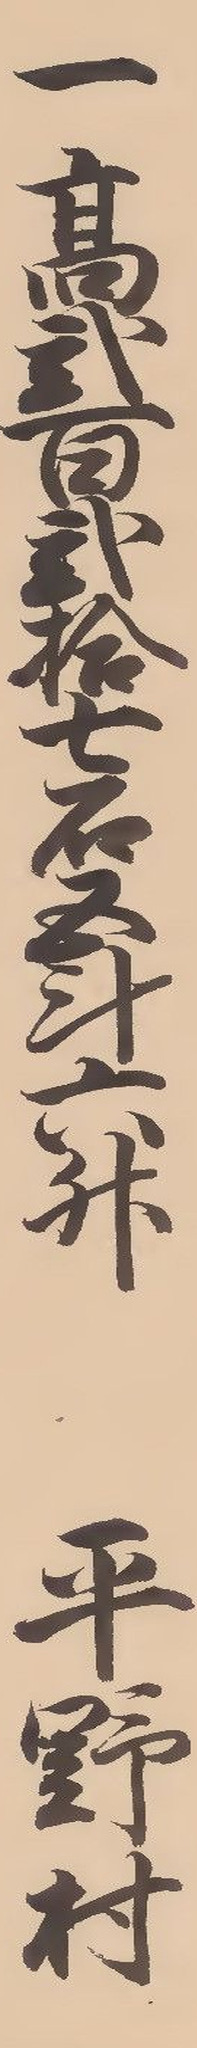一高弐百弐拾七石五斗六升平野村
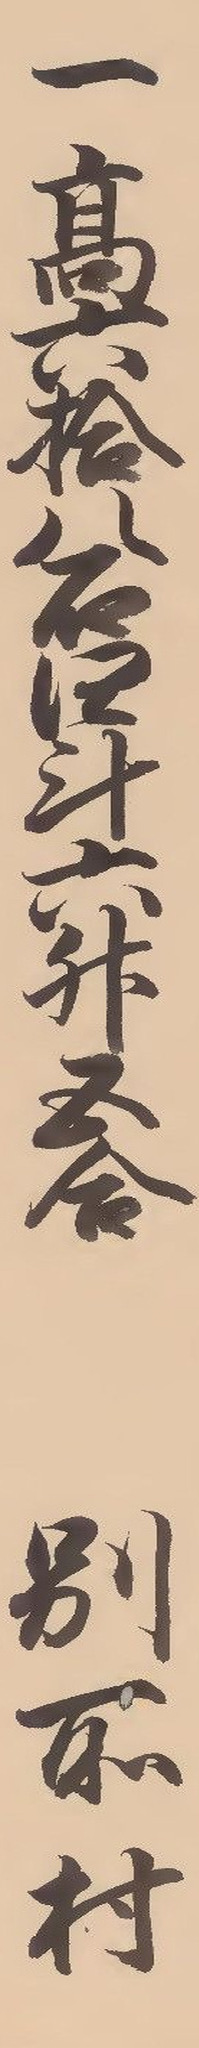一高六拾八石四斗六升五合別所村
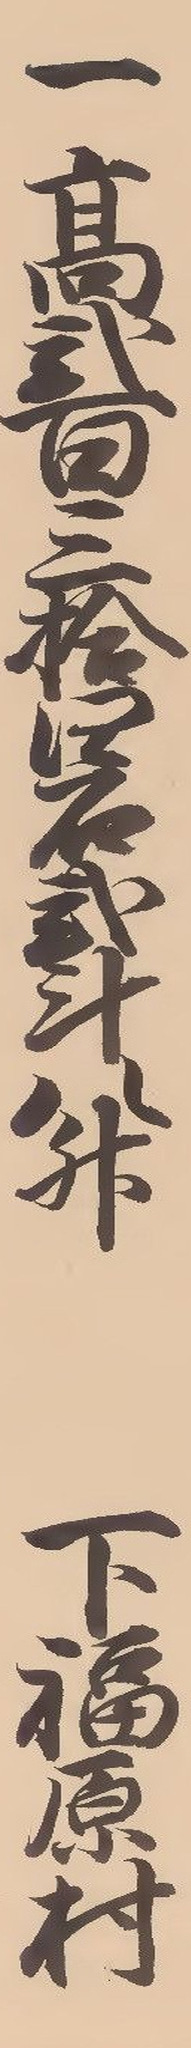一高弐百三拾四石弐斗八升下福原村
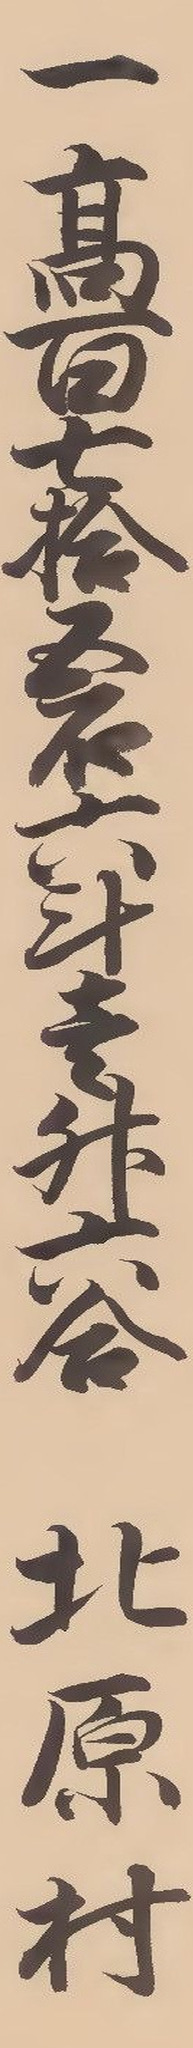一高百七拾五石六斗壱升六合北原村
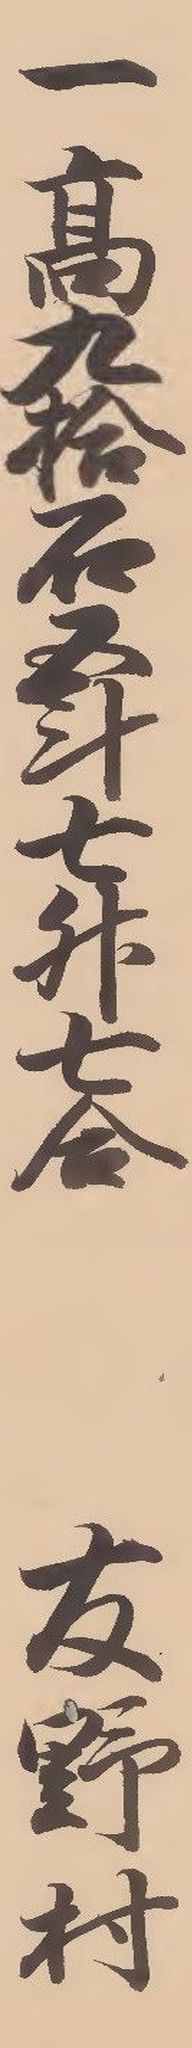一高九拾石五斗七升七合友野村
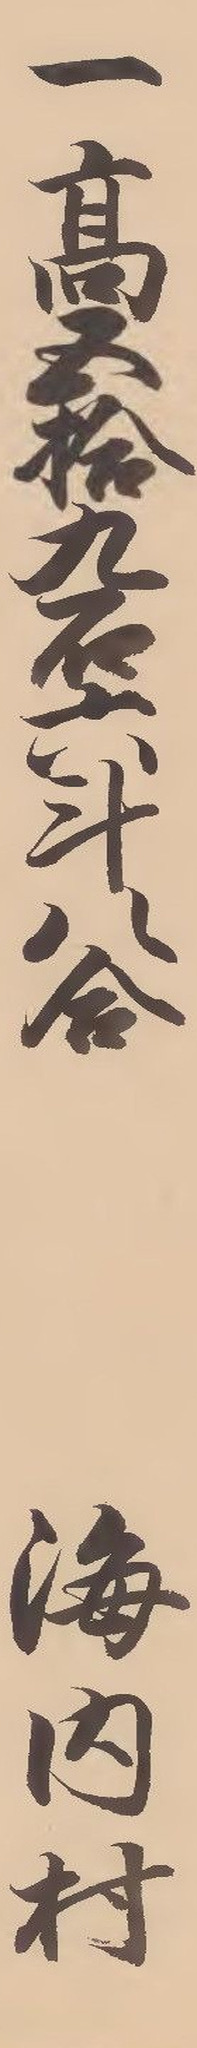一高五拾九石六斗八合海内村
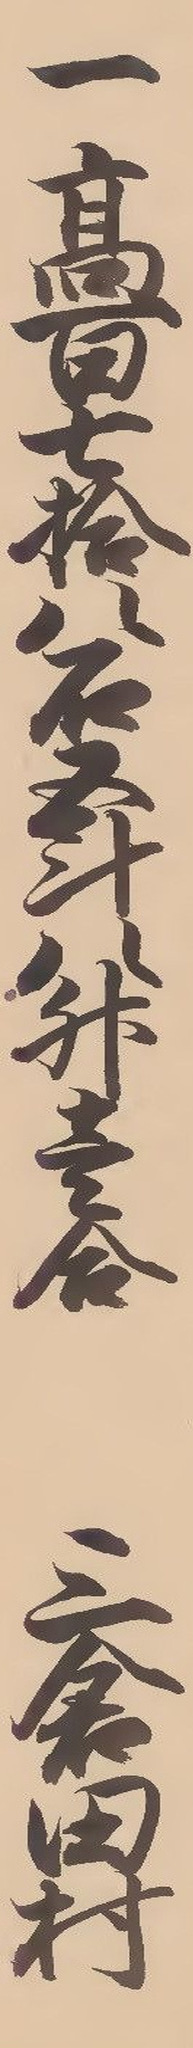一高百七拾八石五斗八升壱合三倉田村

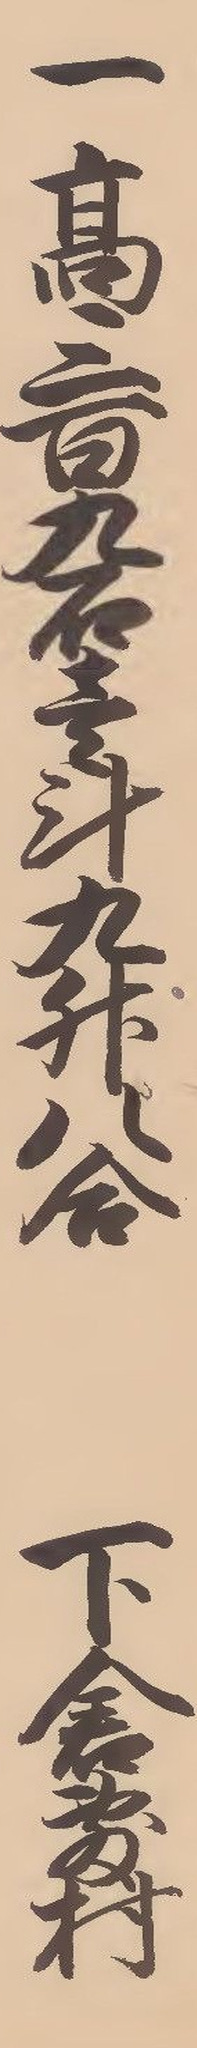一高三百九石壱斗九升八合下倉敷村
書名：美作国郷帳
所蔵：国立公文書館 National Archives of Japan
